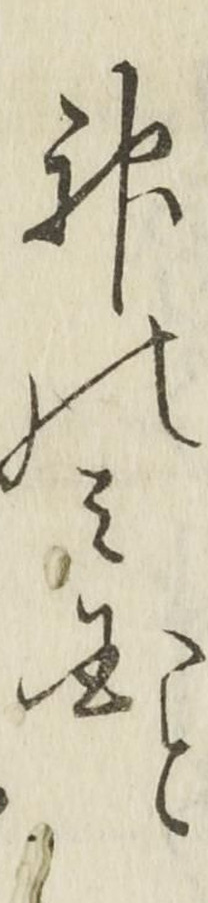神のみ国と
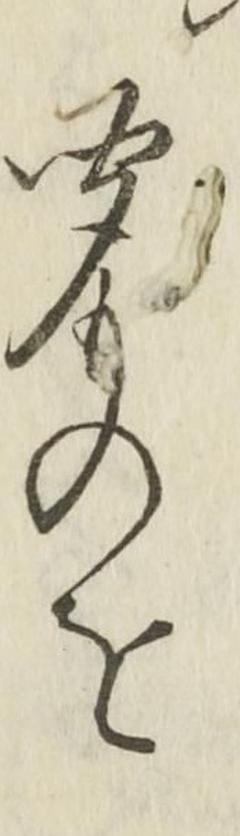聞ものを
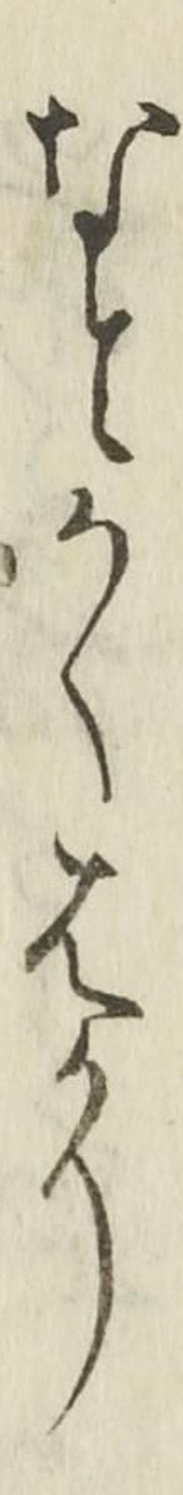なとかくはかり
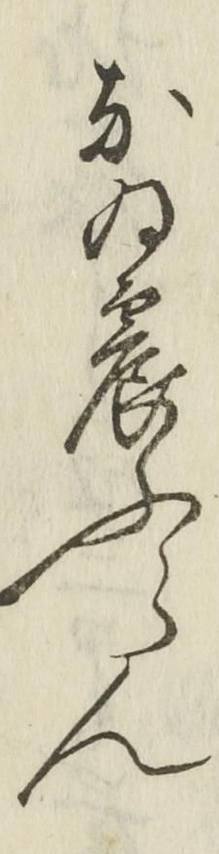なゐ震ふらん
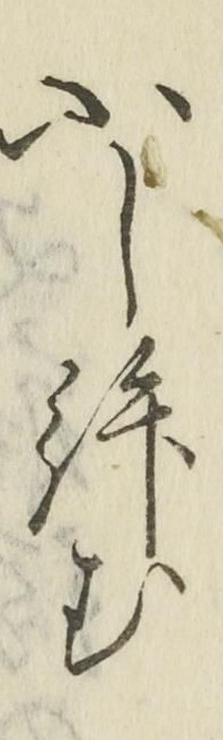ふし拝む
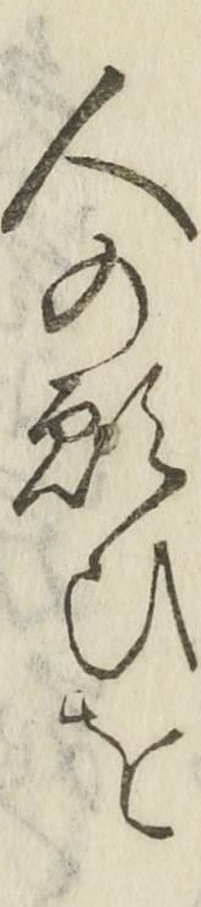人の願ひを
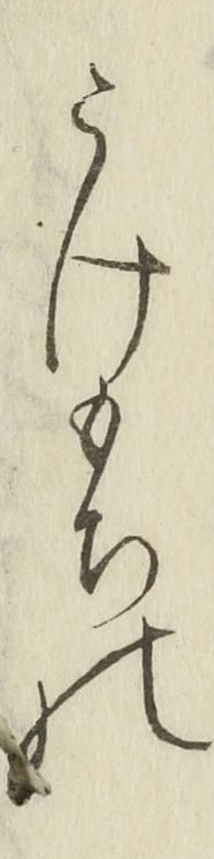うけもちの
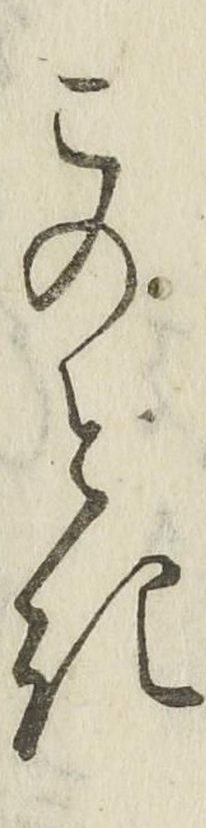このとき

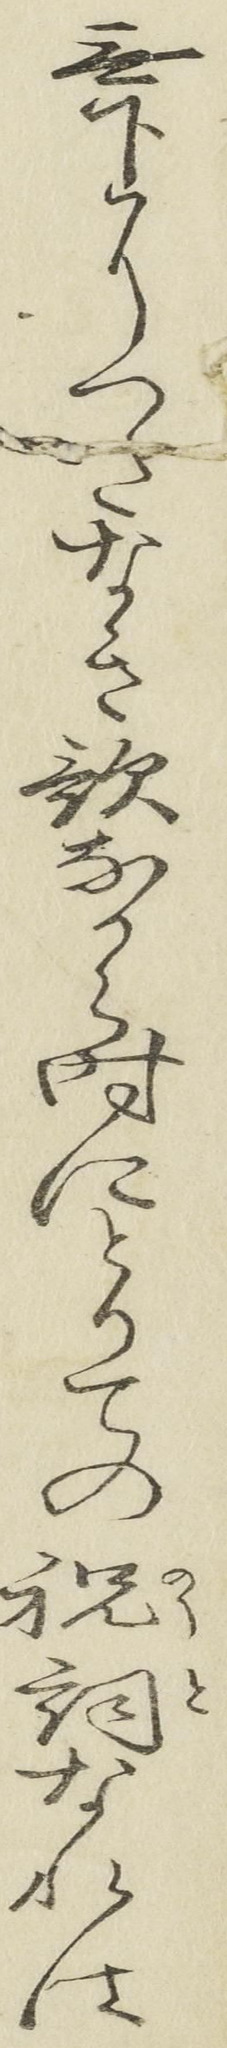無下につたなき歌なから時にとりての祝詞なれは
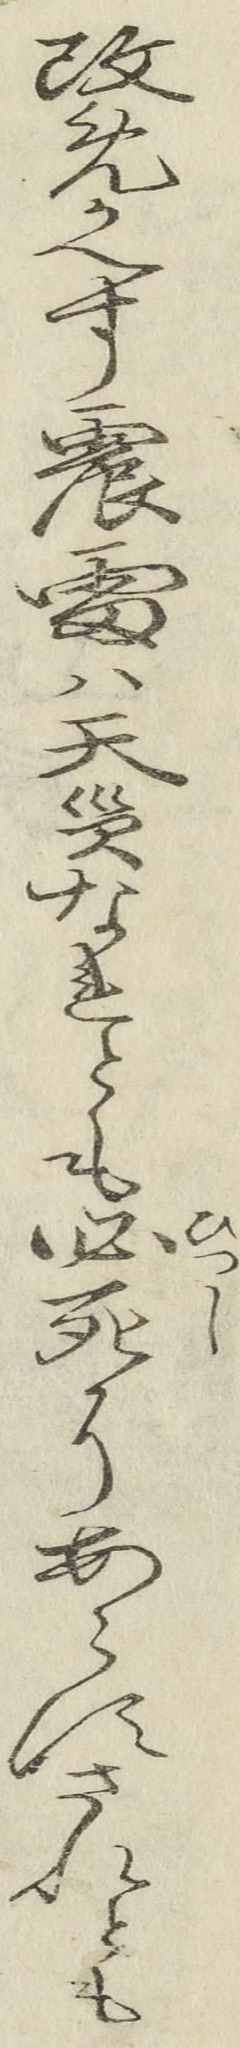改めかへす震雷は天災なれとも必死にあらすされとも
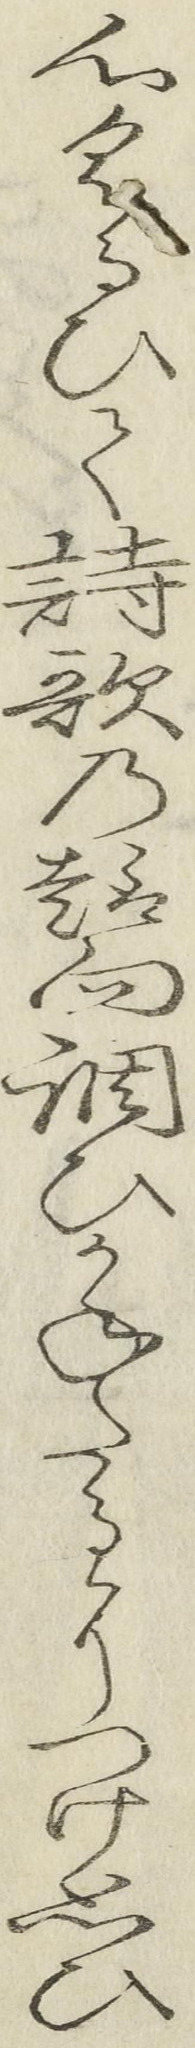心くるひて詩歌の趣向調ひかねたるにつけ思ひ
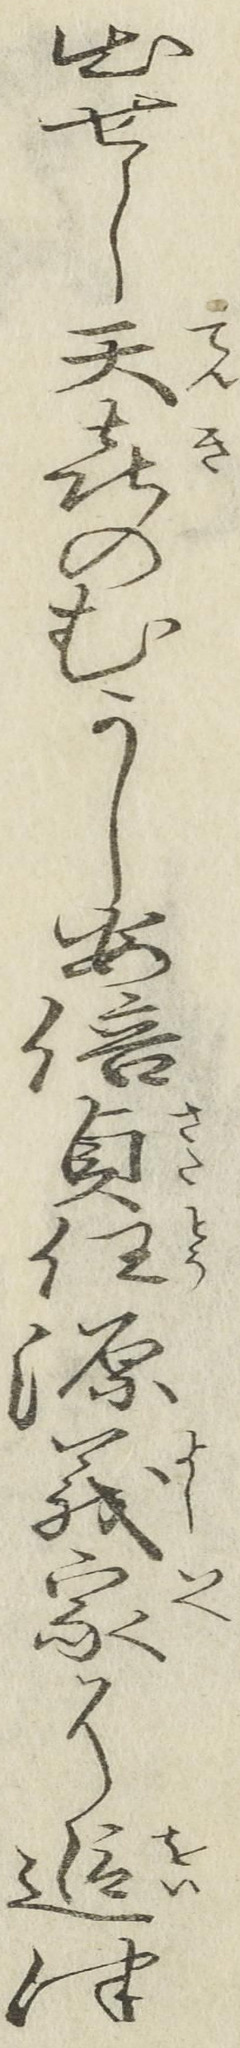出せし天喜のむかし安倍貞任源義家に追つ
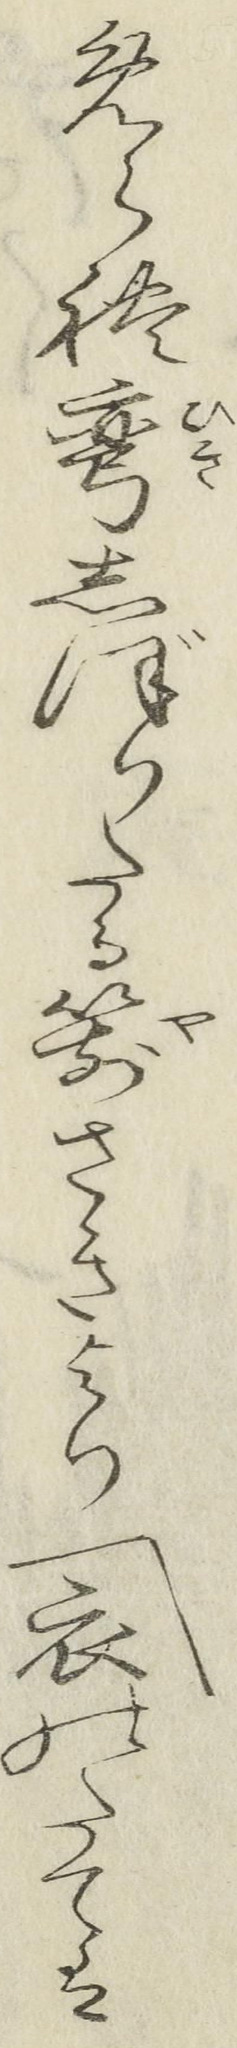められ弯しぼりたる箭さきより「衣のたては
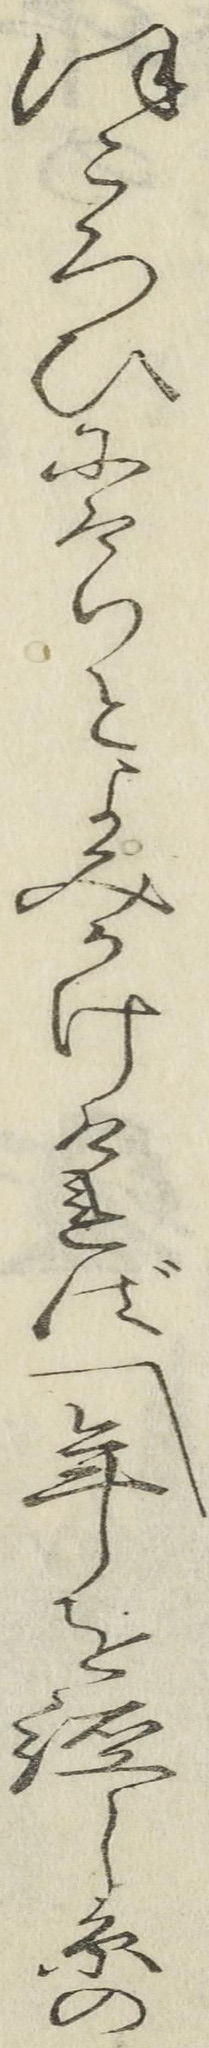ほころひにけりとよみかけければ「年を経し糸の
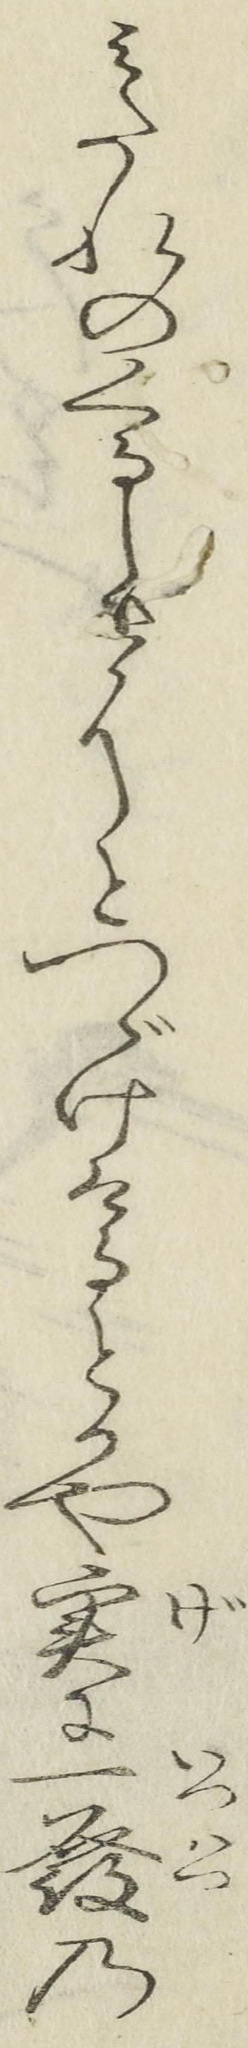みたれのくるしさにとつゞけけるとかや実に一発の
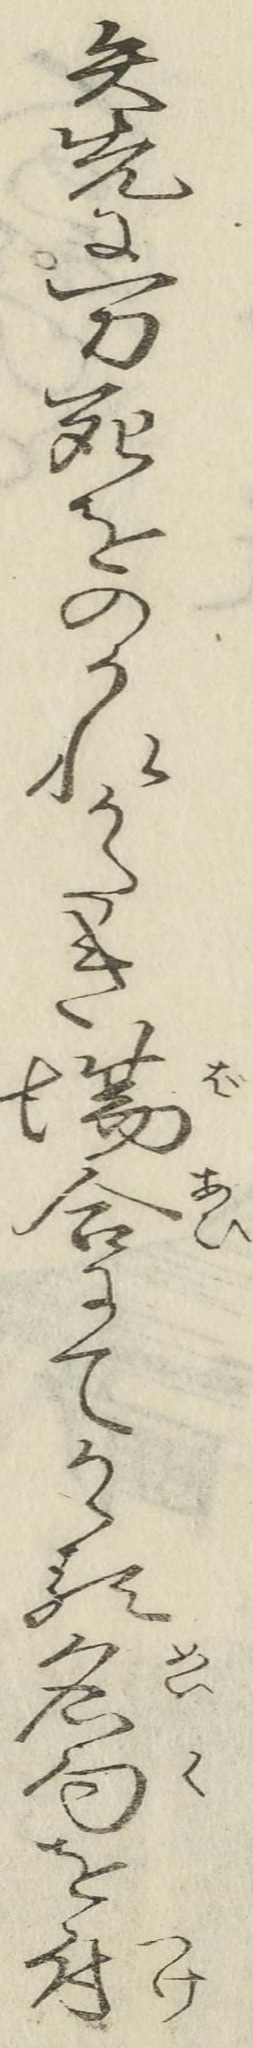矢先に万死をのかれかたき場合にてかゝる名句を付
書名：震雷考説　全
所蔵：東京大学地震研究所図書室 Earthquake Research Institute Library, The University of Tokyo, JAPAN
